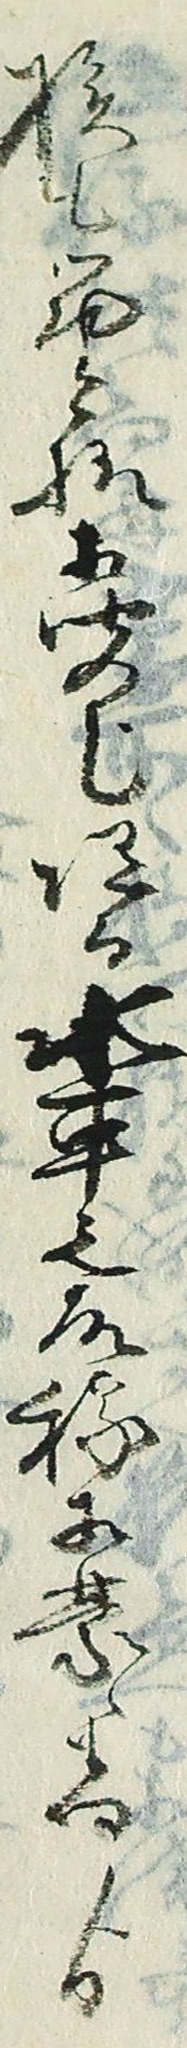様も御坐候様相聞申候随而水車元取稼相蒙候者ゟ
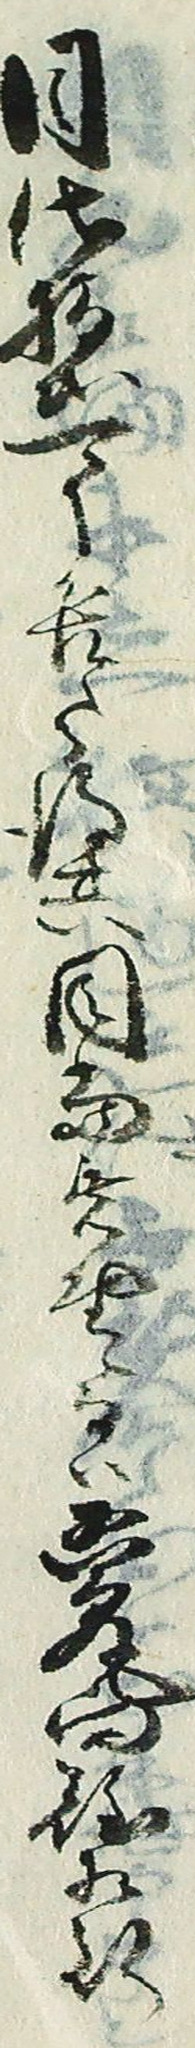目代指出可申筈に候得共目当無御坐候而は右究向難相行
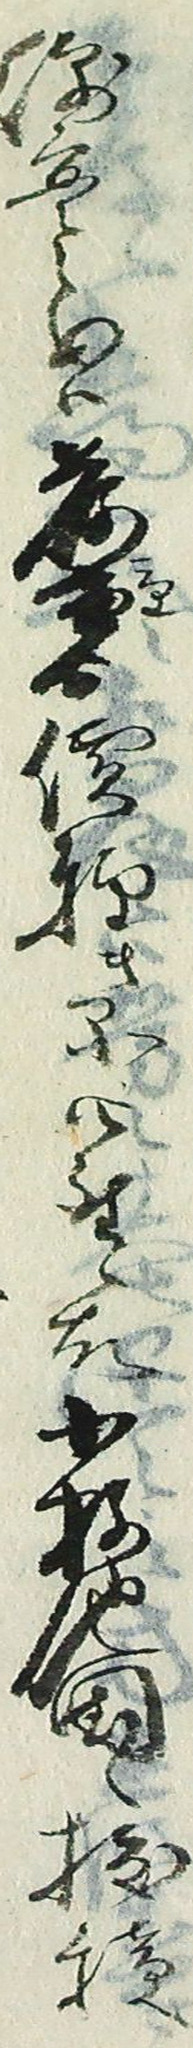綿實之義は荷重ゟ価軽き品御坐候故少数他国へ抜積
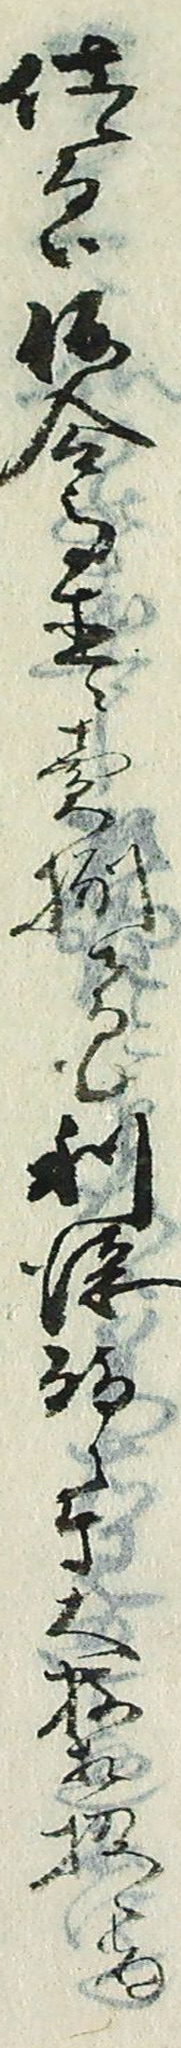仕候而は仮令高直に売捌候而も利徳聊に付大数相扱候者
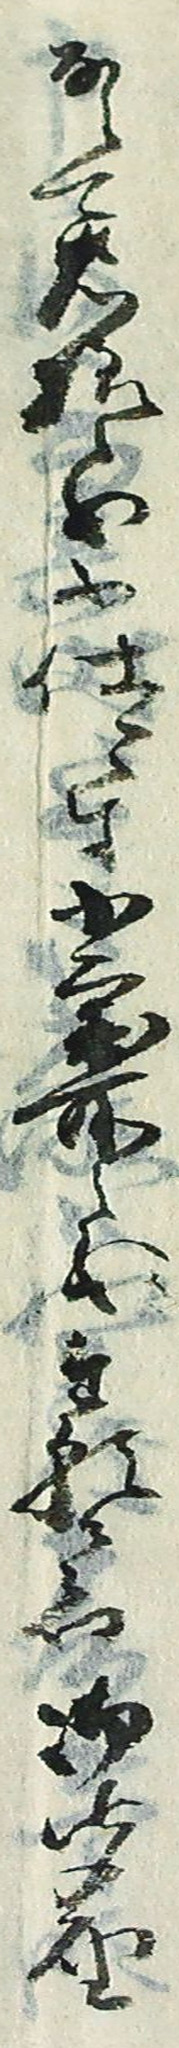ならて右様之義不仕候に付小寄所之義奉願候者御聞届
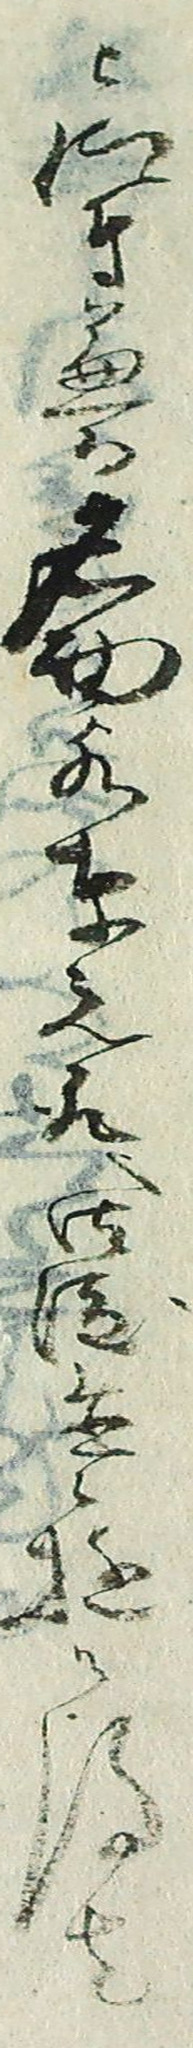被仰付兼而名面水車元取へ御渡置被遊候得者
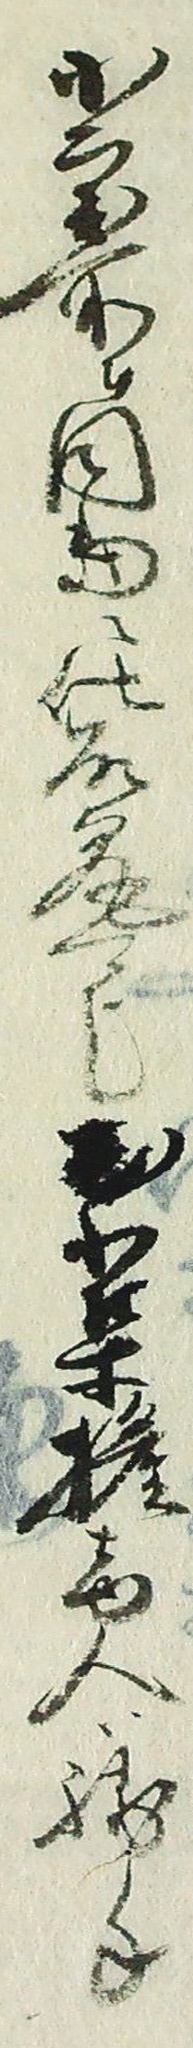小寄所を目当に仕取究可申候尤小集担商人は勝手
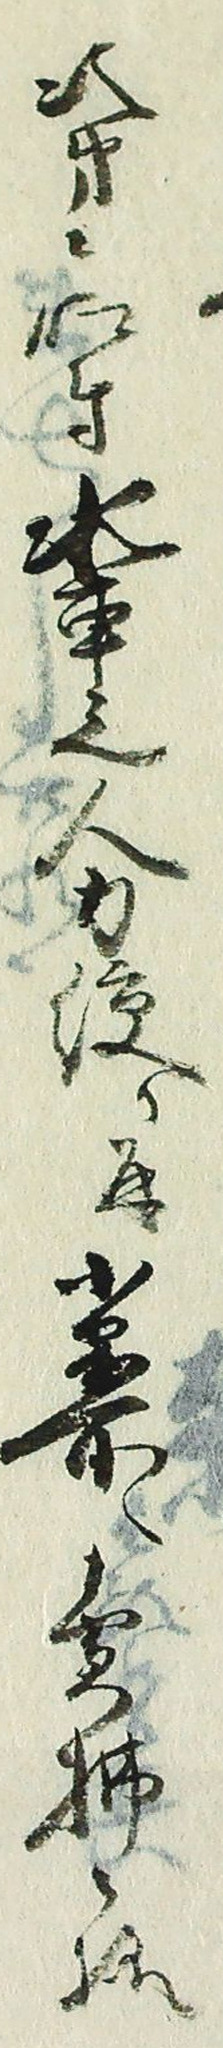次第被仰付水車元人力絞り幷小寄所へ売払候様
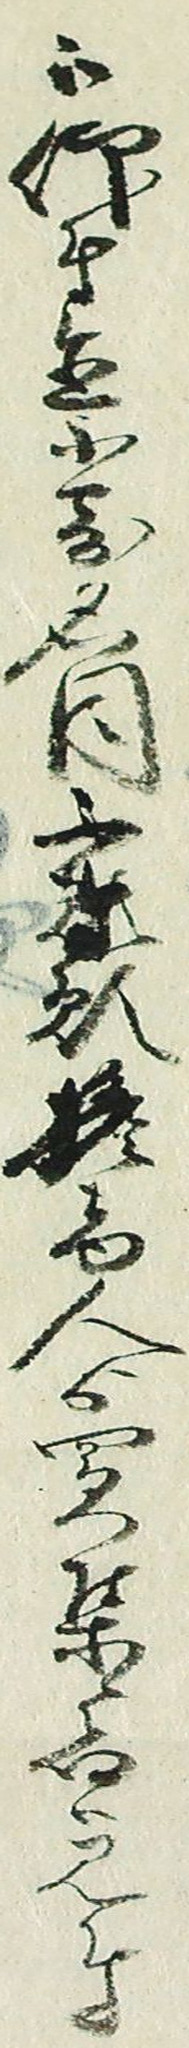被仰付置小寄名目不奉願担商人ゟ買集候者は見付
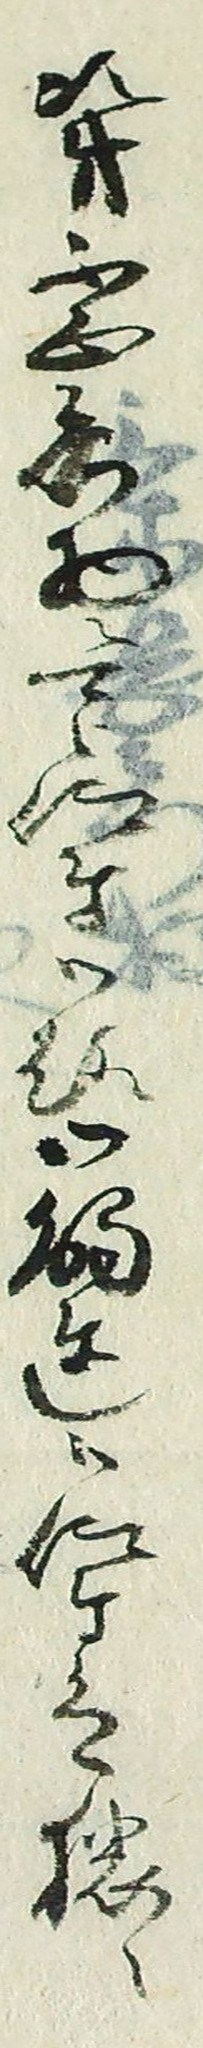次第不正荷物に可被仰付御趣御触達被仰付候はゝ猥に
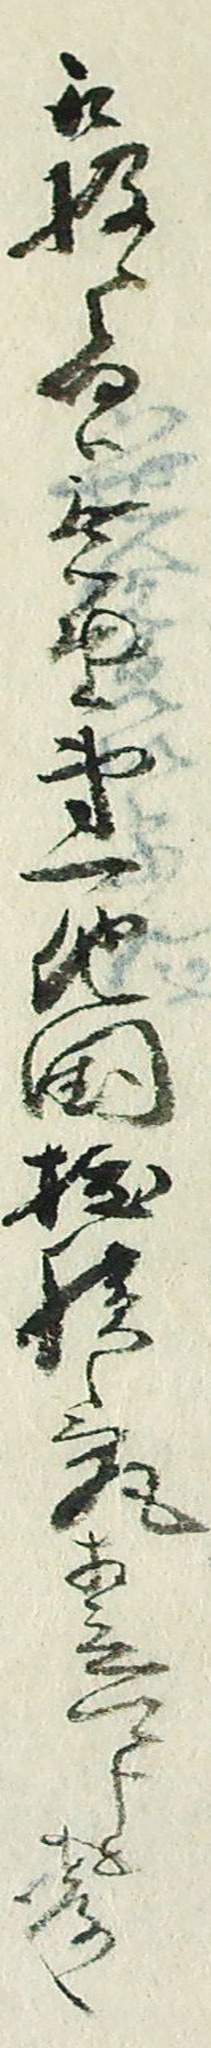取扱候者は無御坐第一他国抜積之究相立可申と奉存候
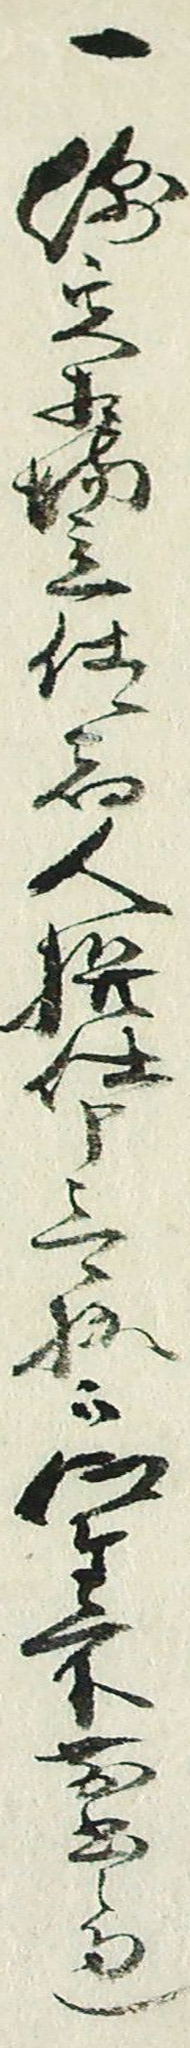一綿実相場立仕候者人撰仕申上候様被仰付候所前書之通
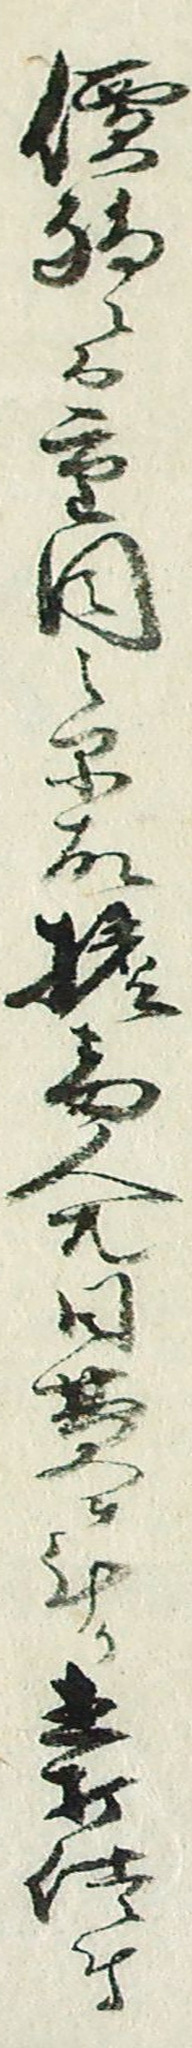価聊に而重目之品故担商人共日費を計り直打仕候付
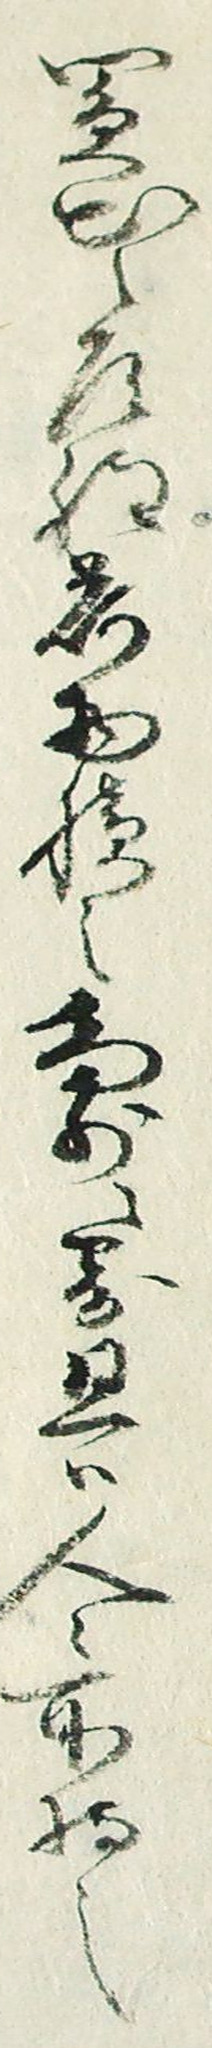買出之道程荷物積之多少に寄且は人々所持之

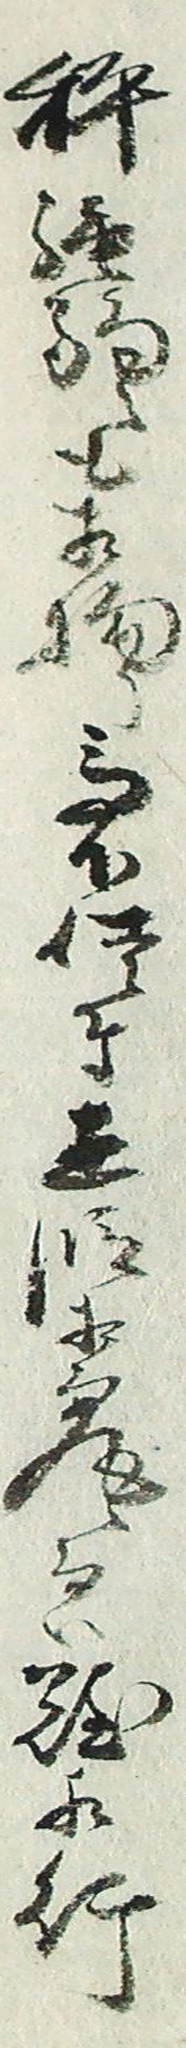秤強弱にも相拘り高下仕候付直段相究候而は難相行
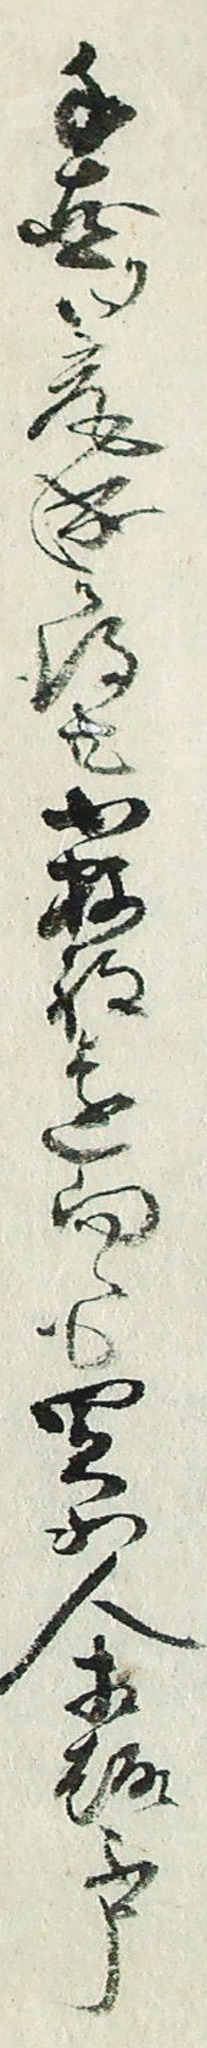手固く御究成候得者小数程遠向へも買出人相趣不申
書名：油稼御取究ニ附御箇條書テ以被仰渡南北同役申談御答書控
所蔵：鳴門教育大学 Naruto University of Education
